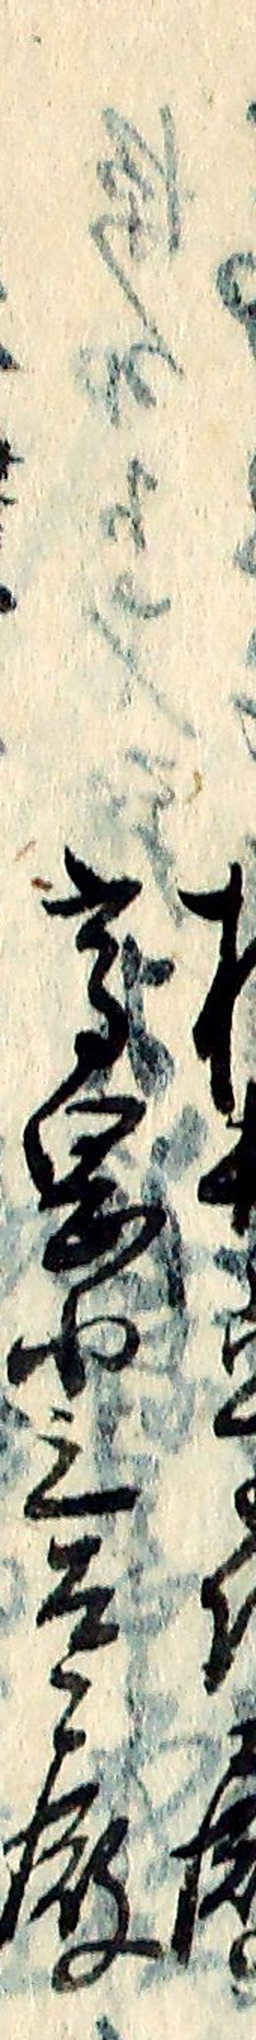高岡小三太殿
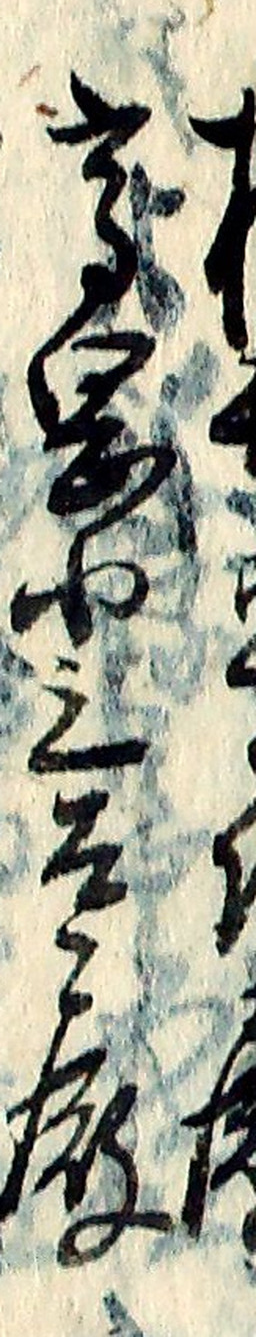高岡小三太殿
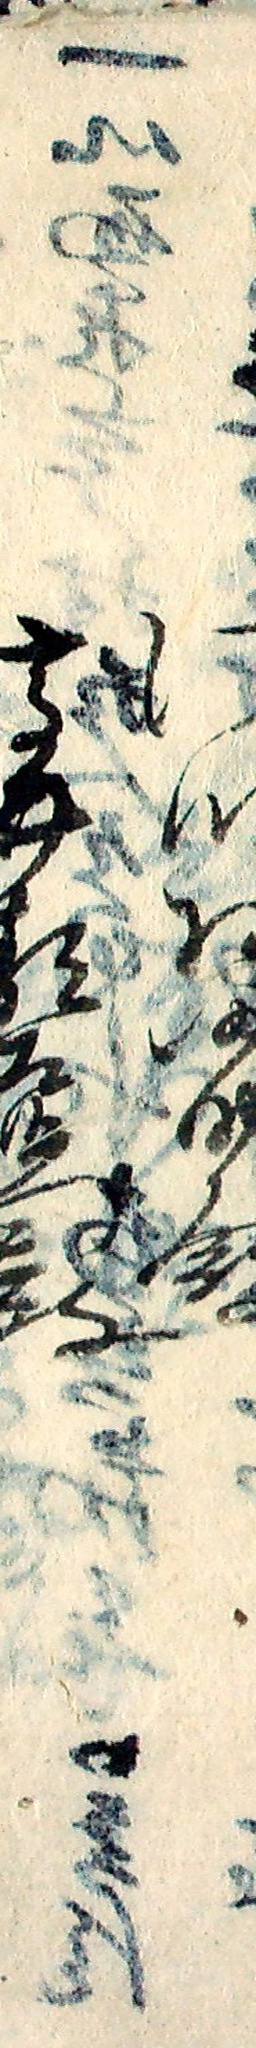高井類左衛門殿
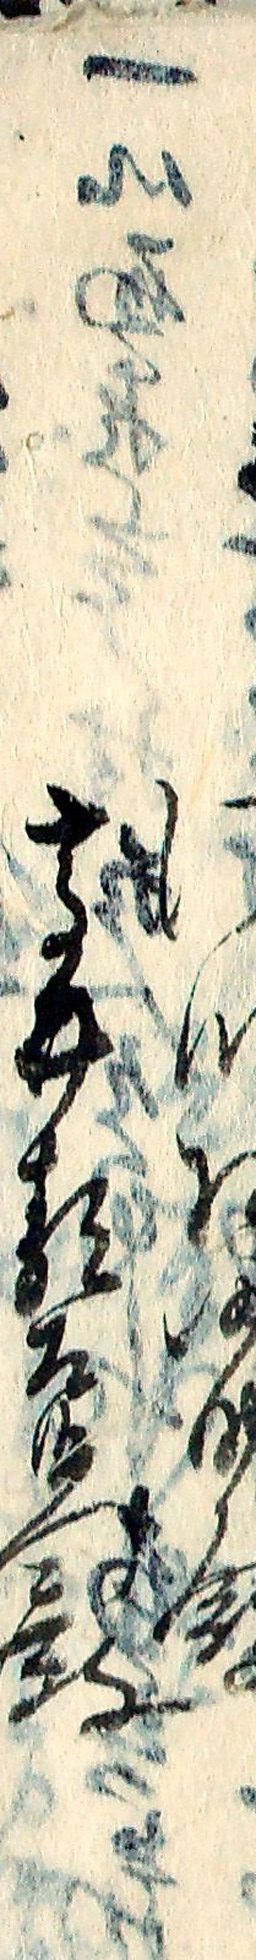高井類左衛門殿
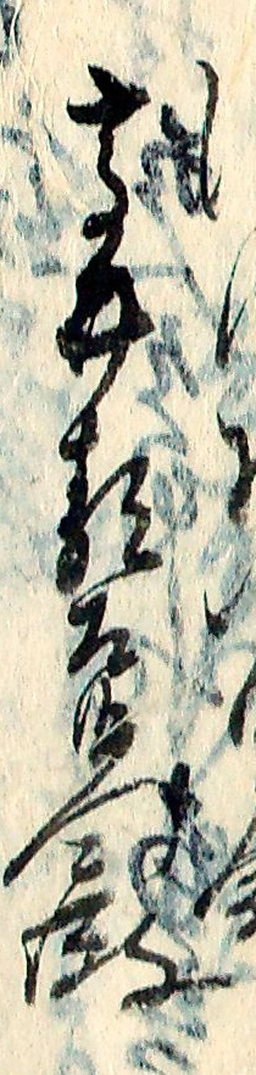高井類左衛門殿

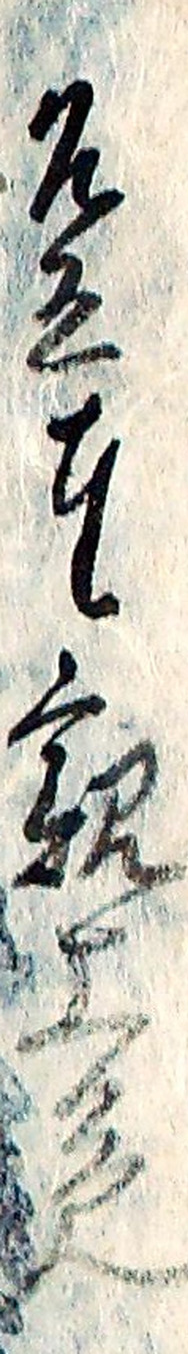乍恐奉窺上覚
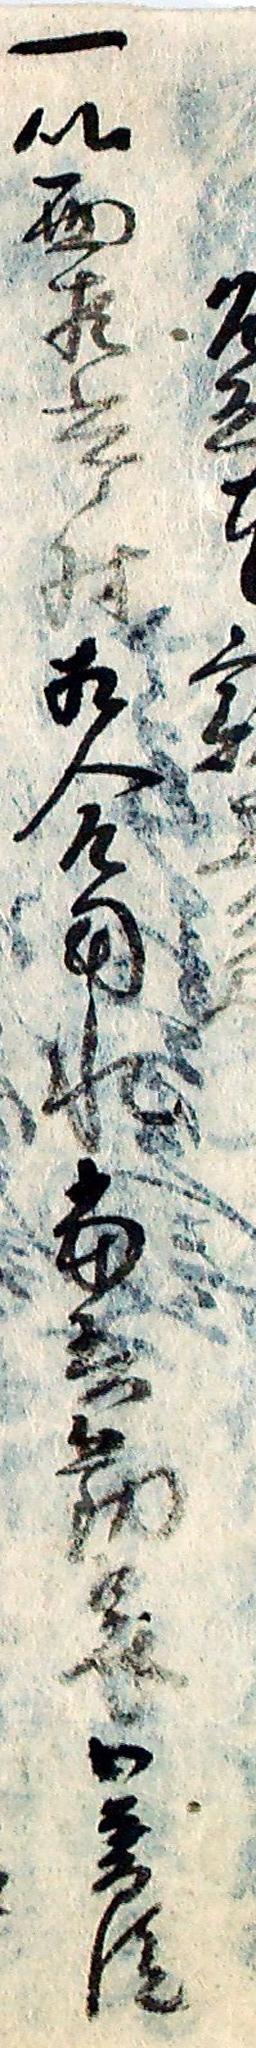一以西拾六ヶ村相合用水当春勧農御普請
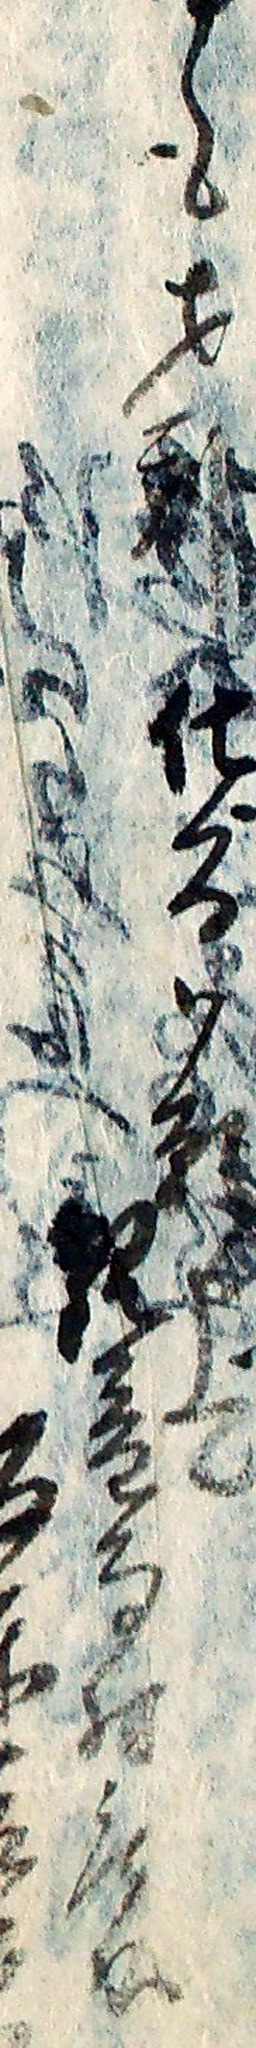観音寺村庄屋
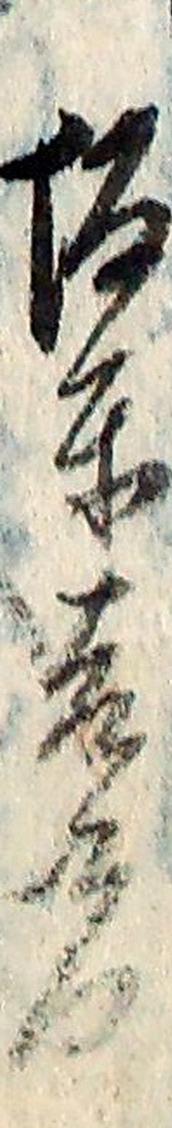坂東吉右衛門
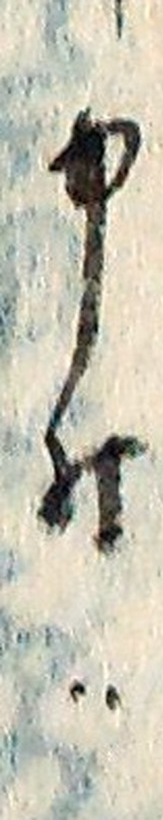中村同
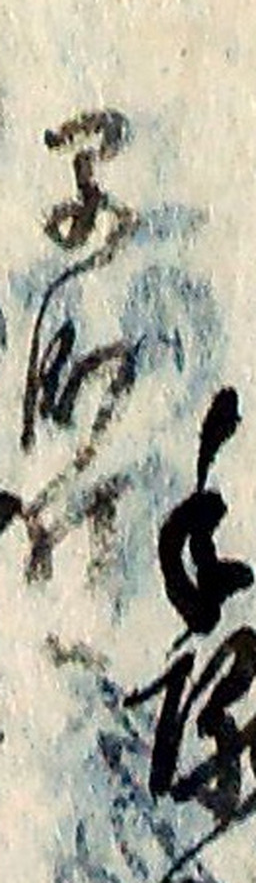早淵村同
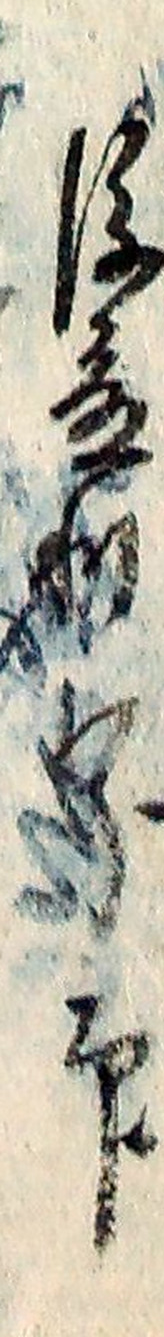後藤利八郎印
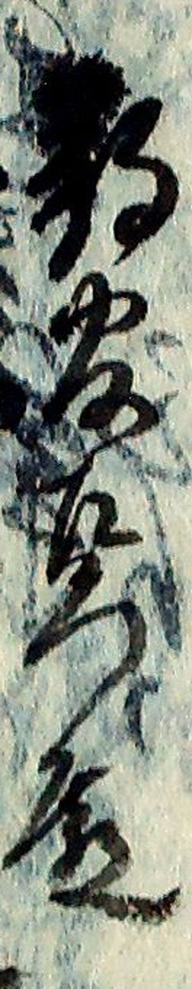郡官左衛門殿
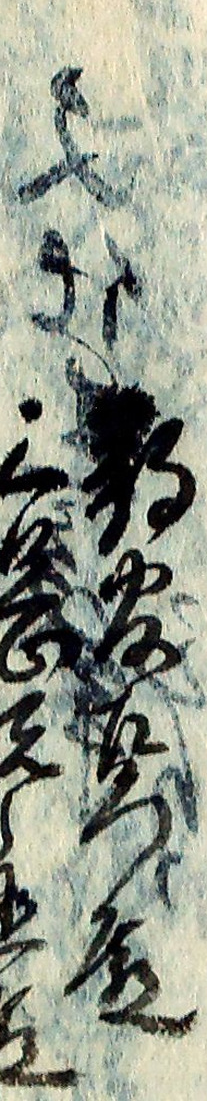郡官左衛門殿
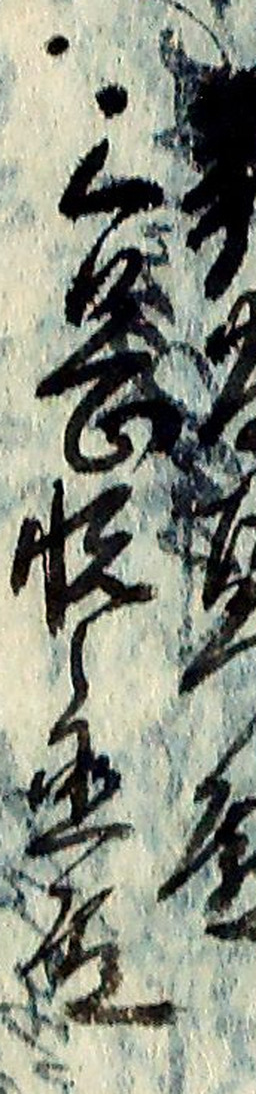三岡悦之丞殿
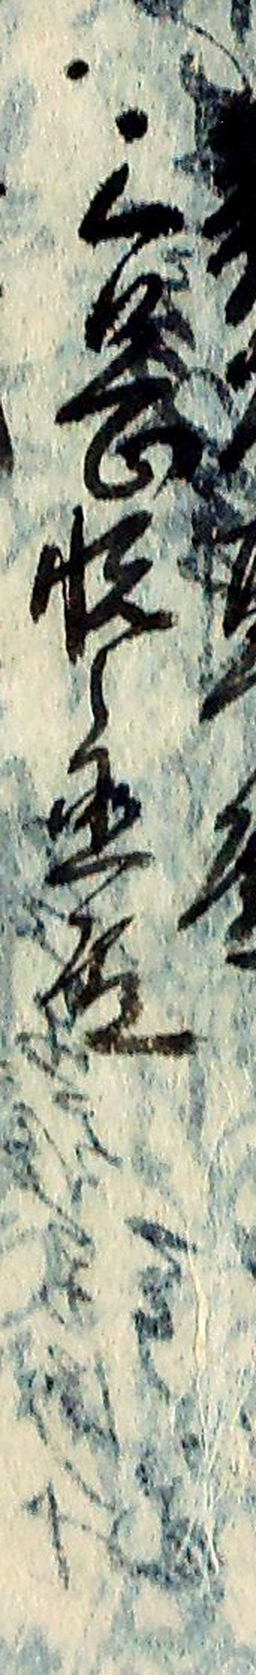三岡悦之丞殿
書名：諸御願書控(後藤氏壱番）
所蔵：鳴門教育大学 Naruto University of Education
